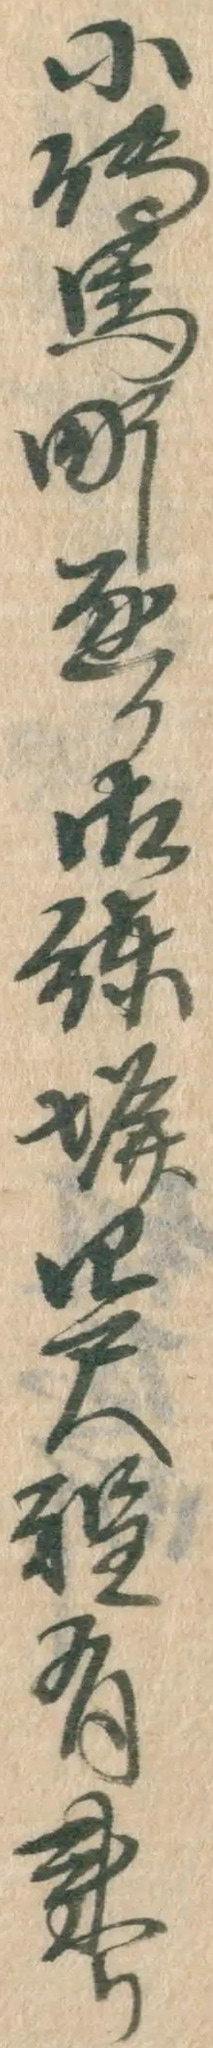小伝馬町通り御練塀四尺程有来り
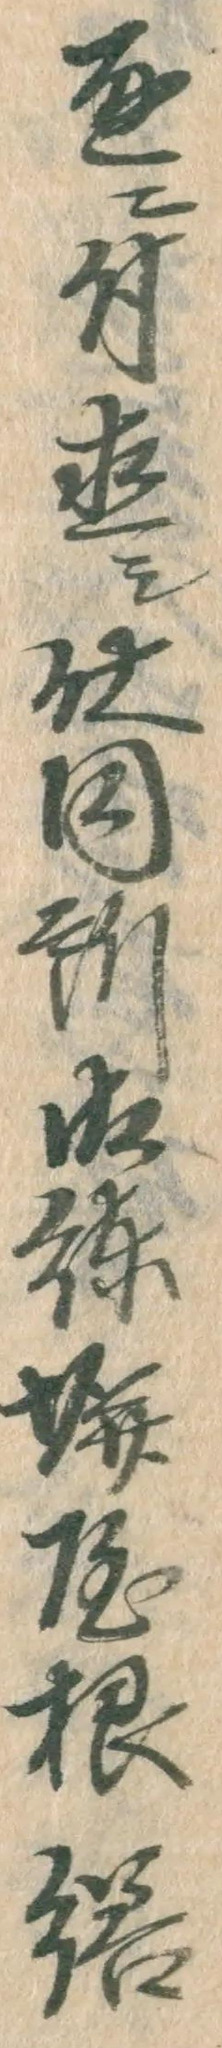通ニ付直シ仕同所御練塀屋根繕
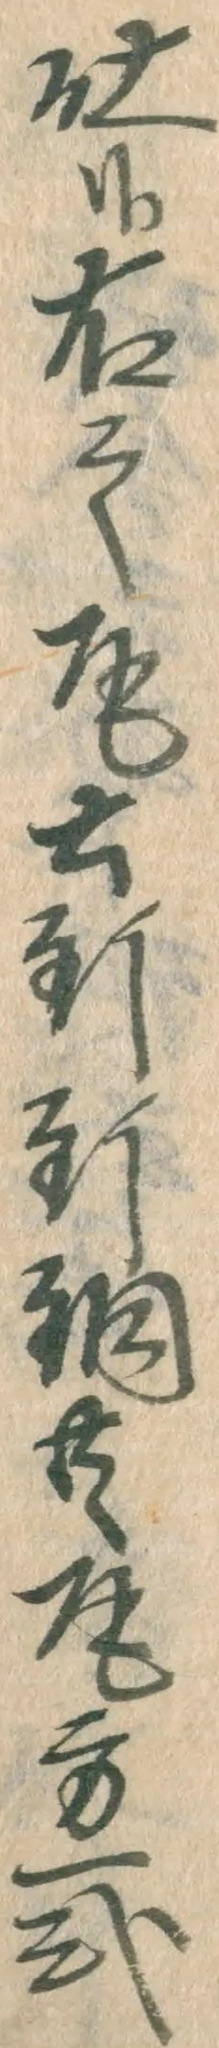仕候右之瓦大釘釘鋼共瓦方一式

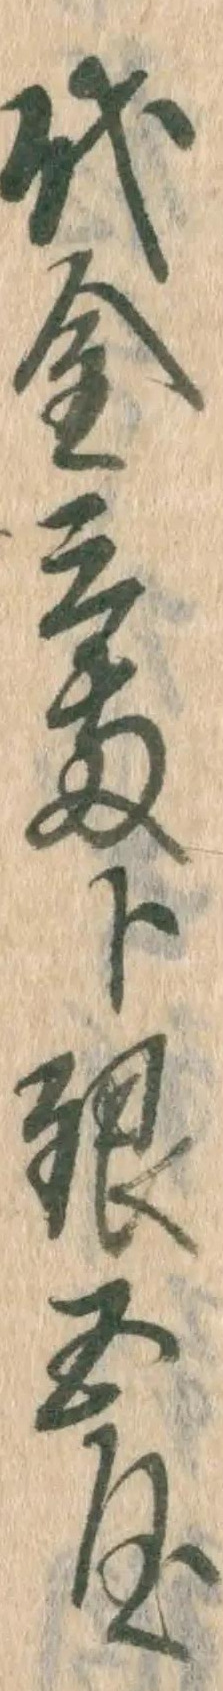代金三両ト銀五匁
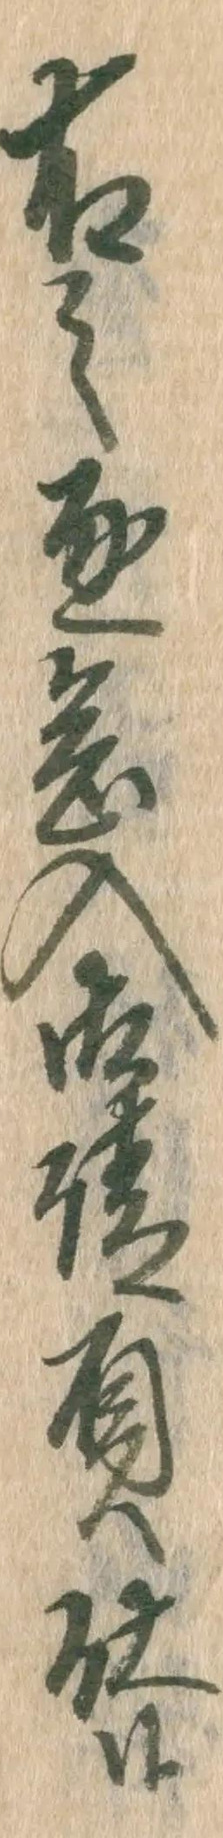右之通念入御請負仕候
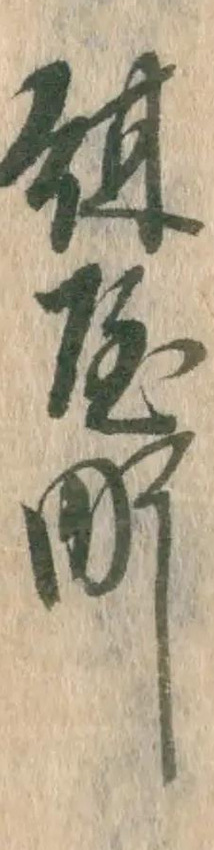紺屋町
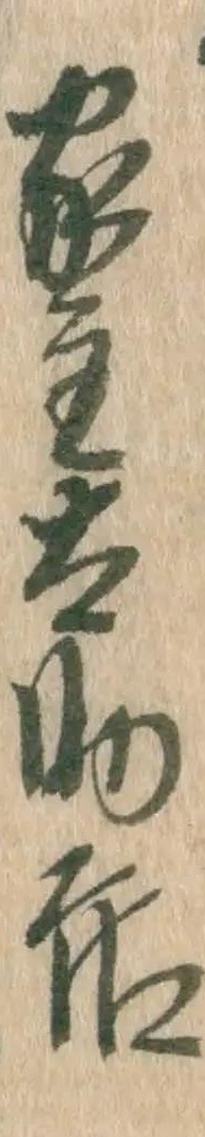家主太助店
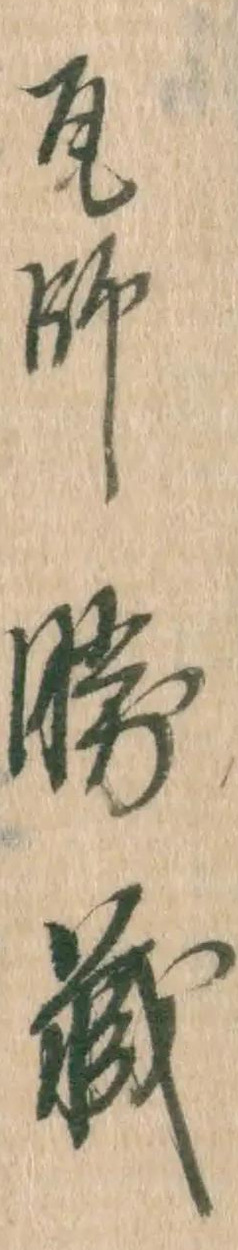瓦師勝蔵
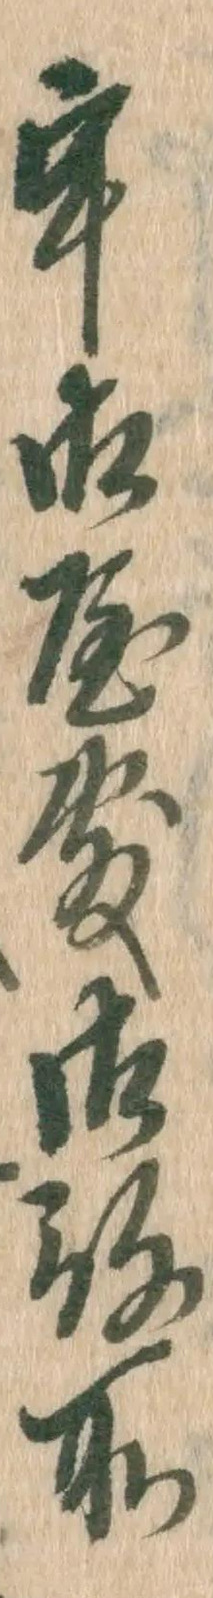牢御屋敷御役所
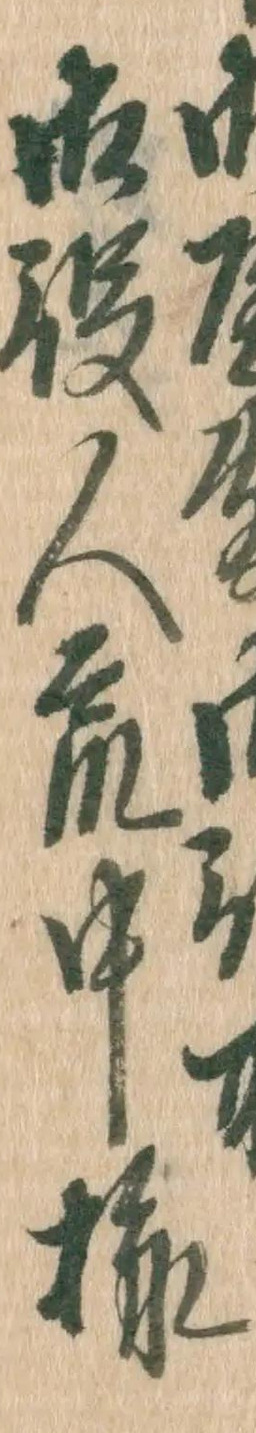御役人衆中様
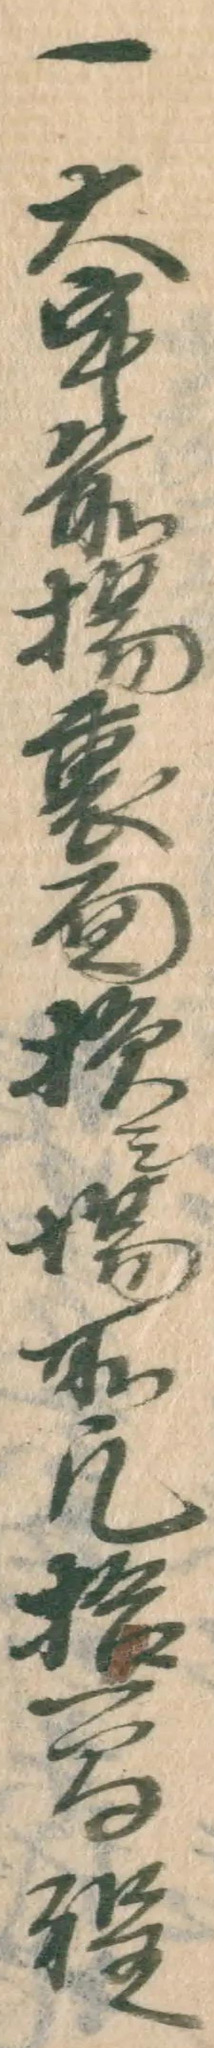一大牢前揚裏面損シ場所凡拾一間程
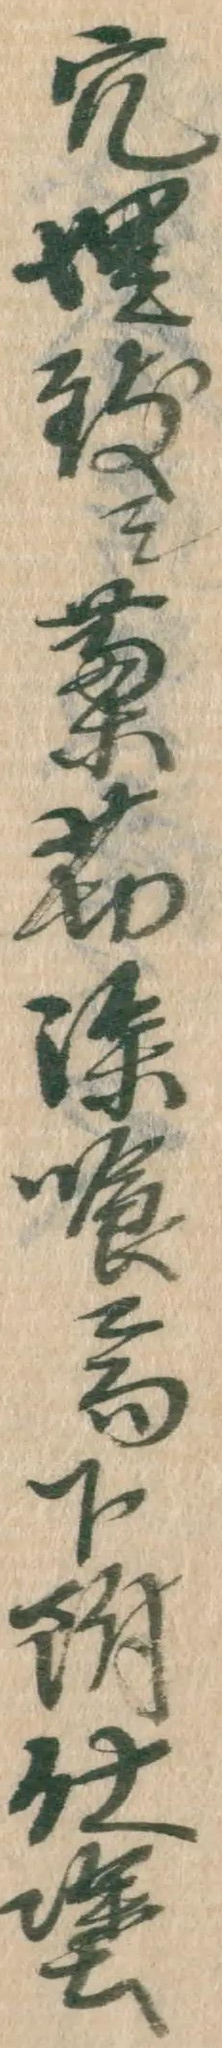穴埋致シ藁苆漆喰ニて下附仕塗
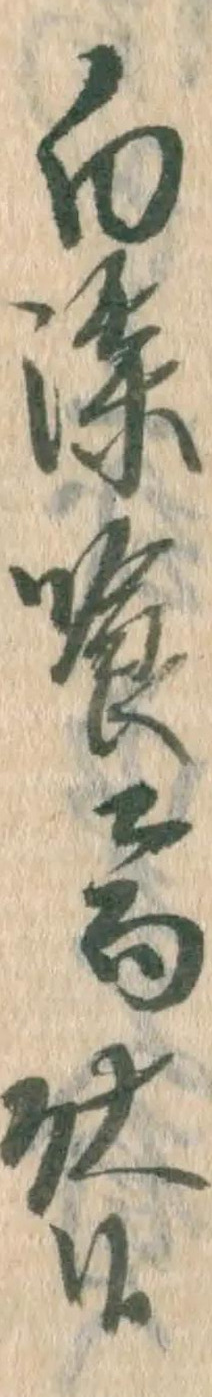白漆喰ニて仕候
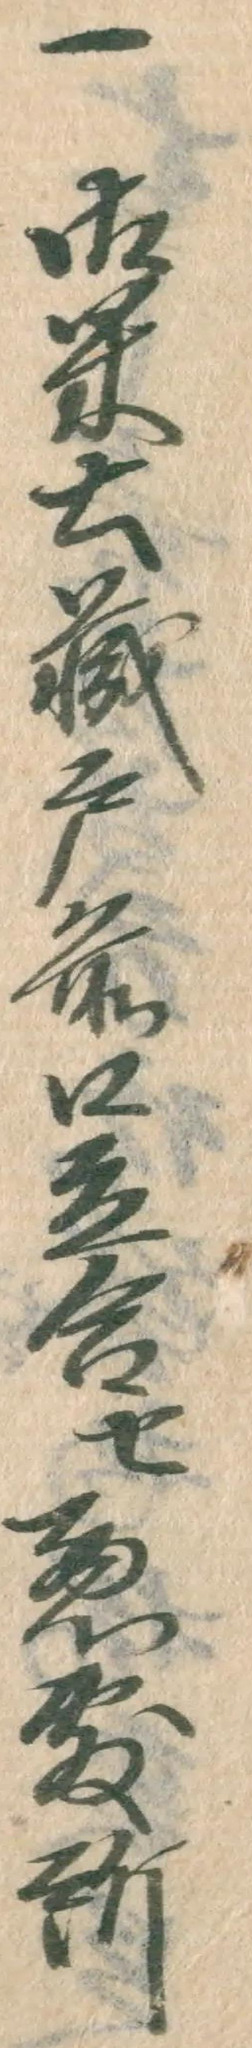一御米土蔵戸前口立合は悪敷所
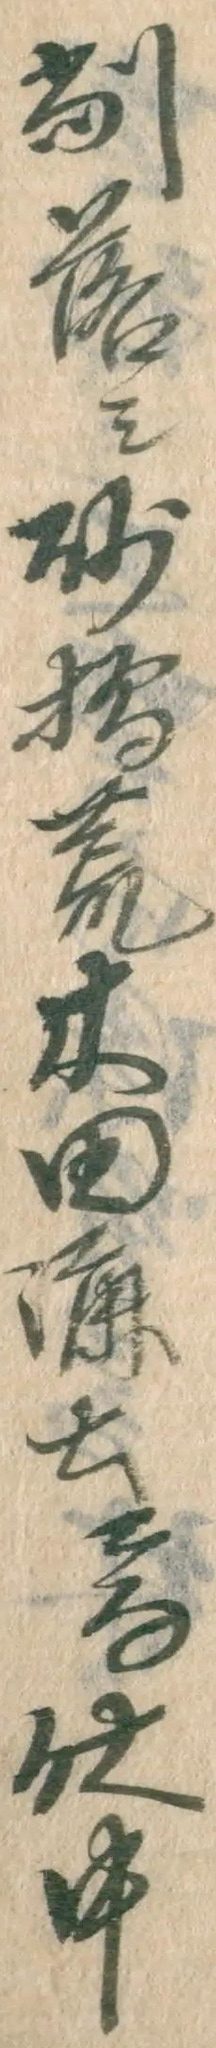削落シ砂摺荒木田漉土ニて仕中

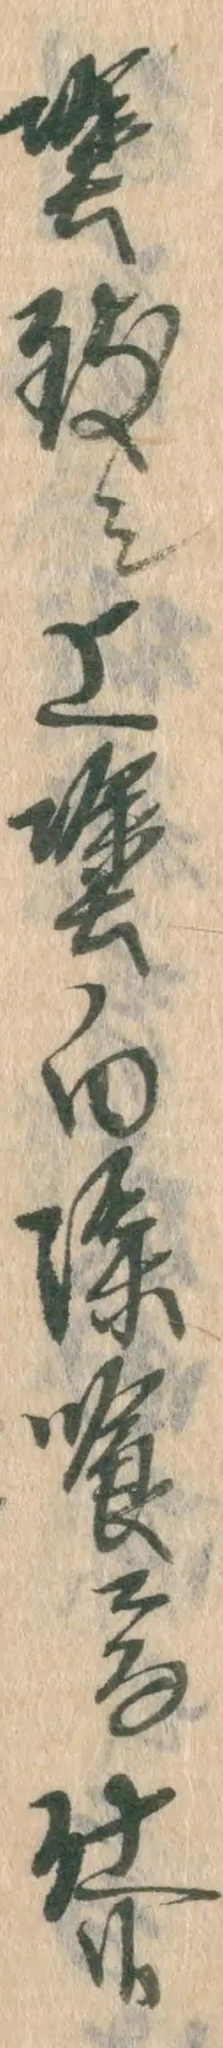塗致シ上塗白漆喰ニて仕候
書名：七十冊物類集 71巻. [44] 四十三 牢屋敷御普請御修覆地震ニ付骨折候牢屋掛御褒美之部
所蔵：国立国会図書館 National Diet Library, JAPAN
